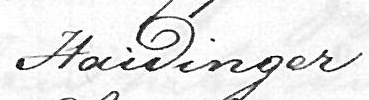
Haidinger
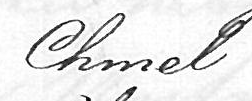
Chmel
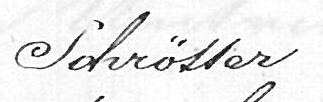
Schrötter
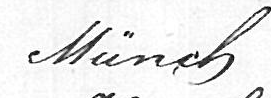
Münch
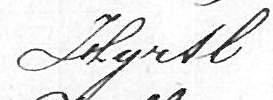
Hyrtl
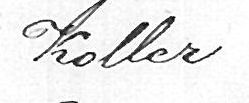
Koller
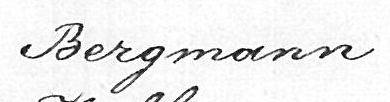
Bergmann
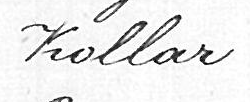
Kollar
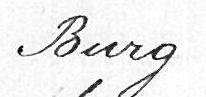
Burg
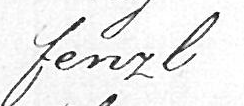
Fenzl
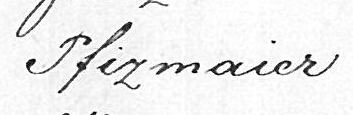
Pfizmaier
